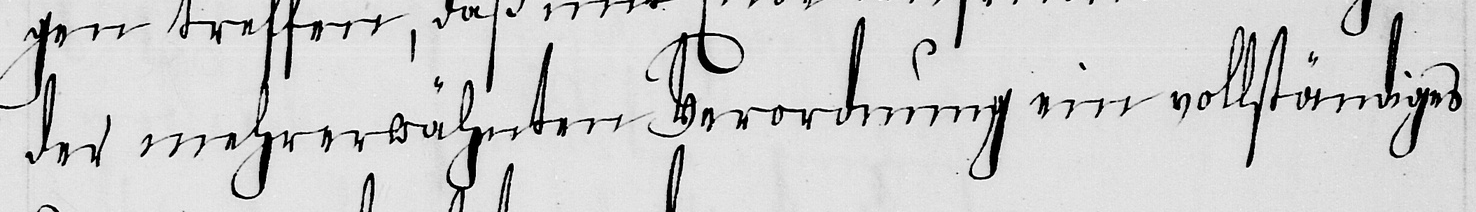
der mehrerwähnten Verordnung ein vollständiges
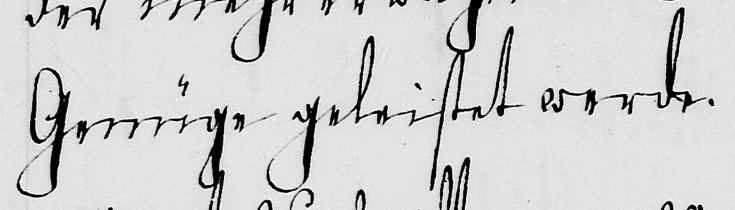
Genüge geleistet werde.
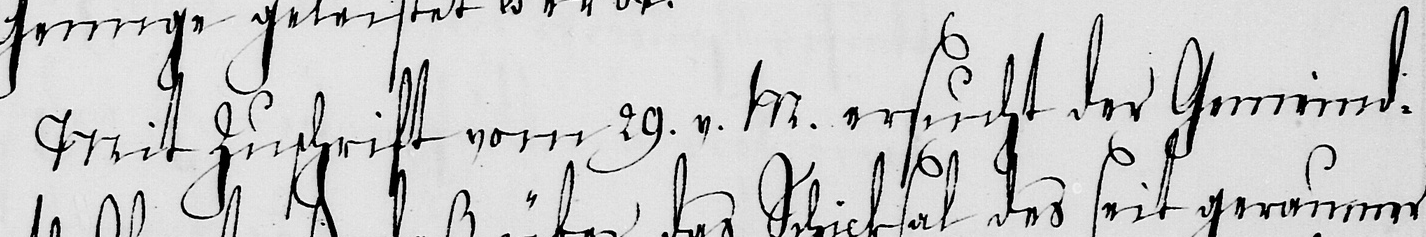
Mit Zuschrift vom 29. v. M. ersucht der Gemeindr¬
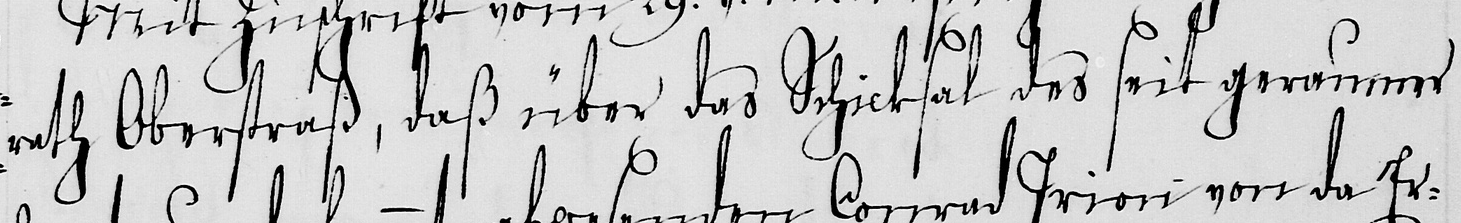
ath Oberstraß, daß über das Schicksal des seit geraumer
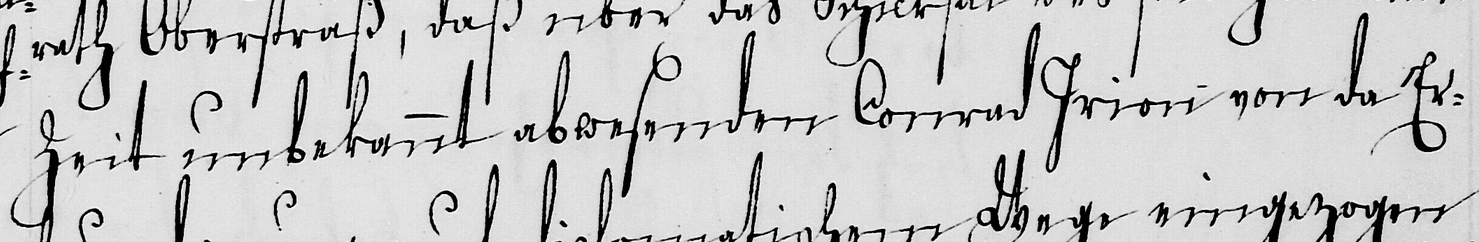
Zeit unbekannt abwesenden Conrad Irion von da Er¬
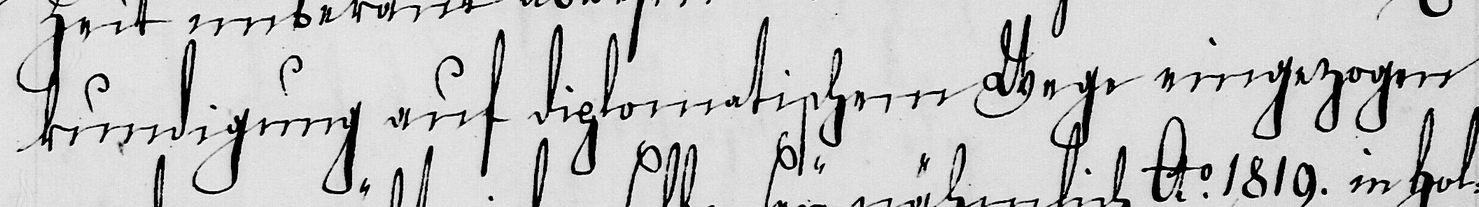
kundigung auf diplomatischem Wege eingezogen
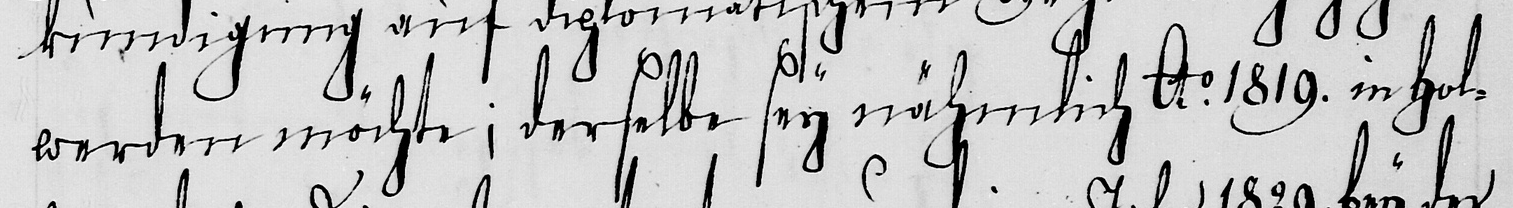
werden möchte; derselbe sey nähmlich Ao. 1819. in Hol¬
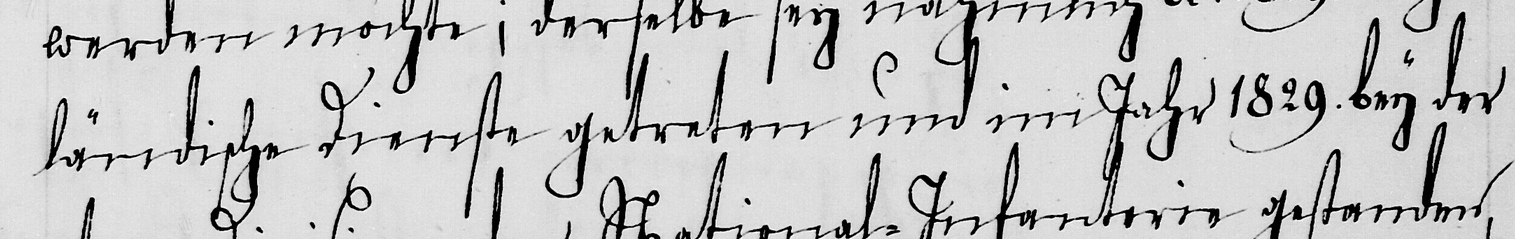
ländische Dienste getreten und im Jahr 1829. bey der
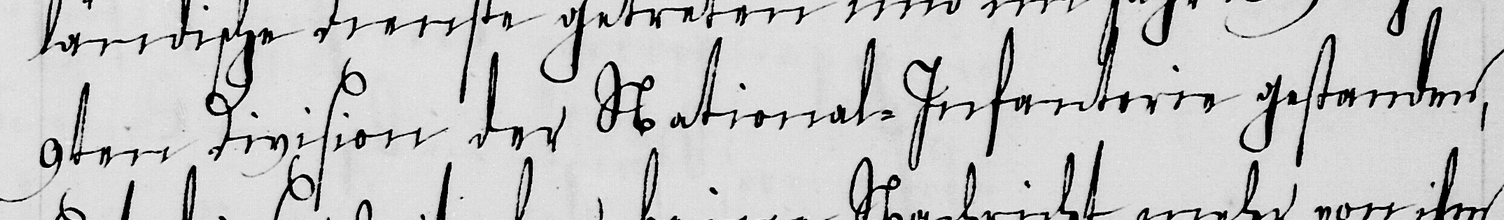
9ten Division der National-Infanterie gestanden,
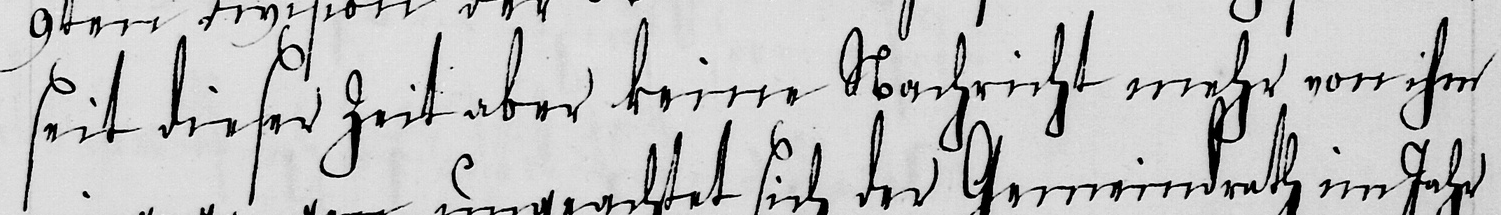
seit dieser Zeit aber keine Nachricht mehr von ihm
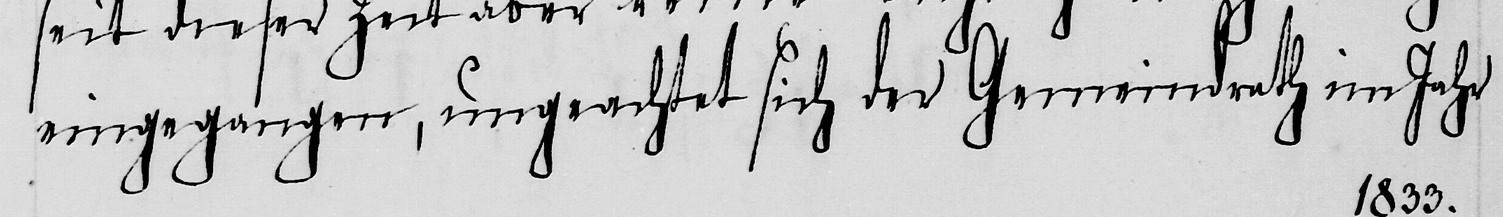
eingegangen, ungeachtet sich der Gemeindrath im Jahr
